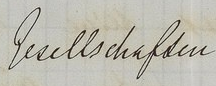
Gesellschaften
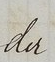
24. d.
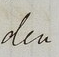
werden
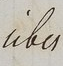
der
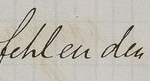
fehlenden
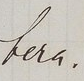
bera-
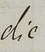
then.
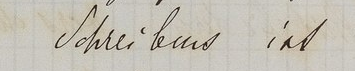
Schreibens ist
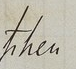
Rede
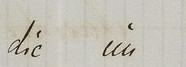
die im
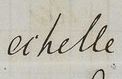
echelle
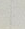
die
